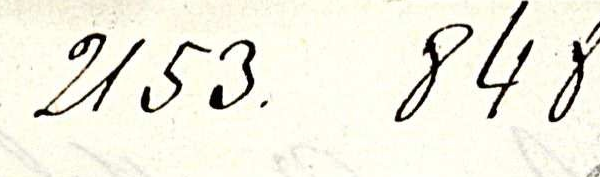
2153 848
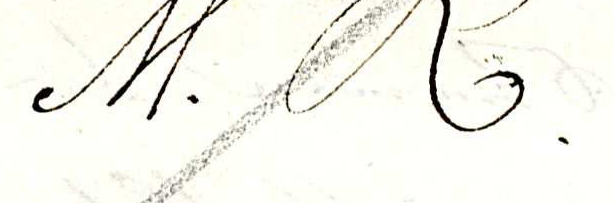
M.R.
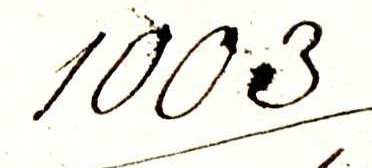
1003
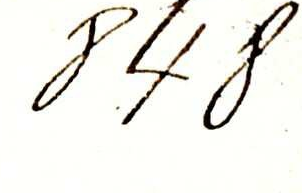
848
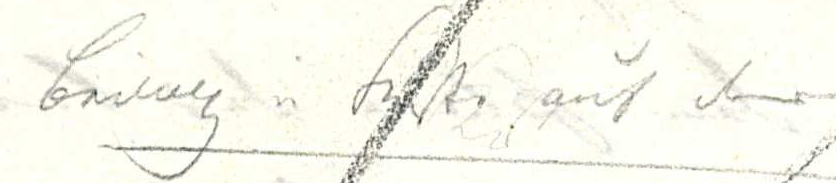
beding in Fuße auf der
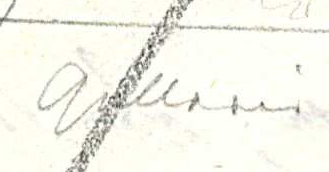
Quellerin
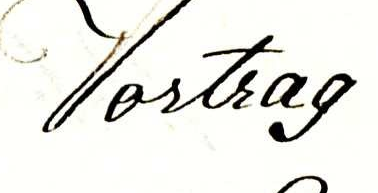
Vortrag
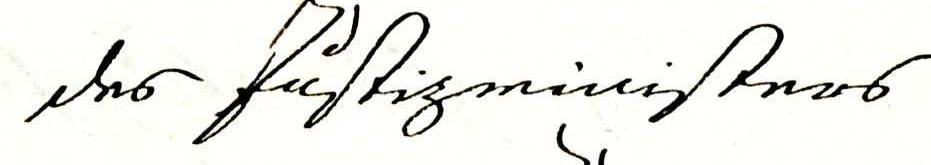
des Justizministers
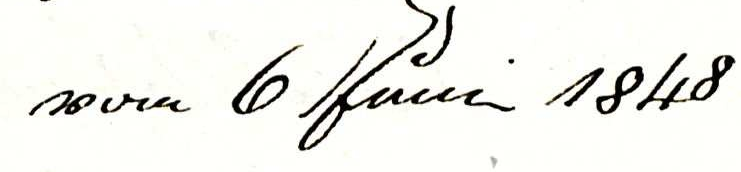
vom 6. Juni 1848
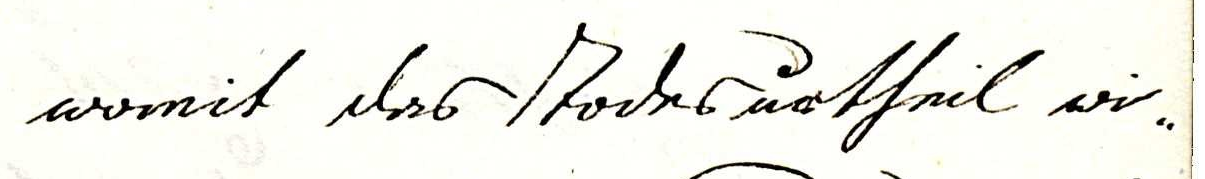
womit das Todesurtheile wi¬
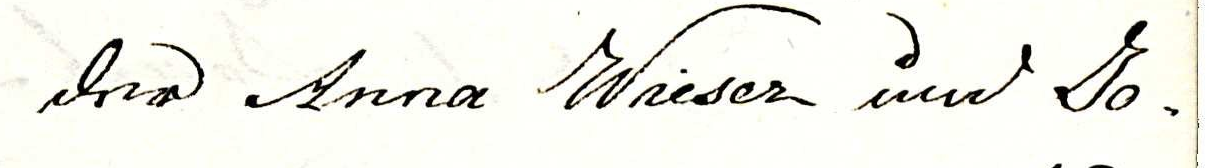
der Anna Wieser und Jo¬
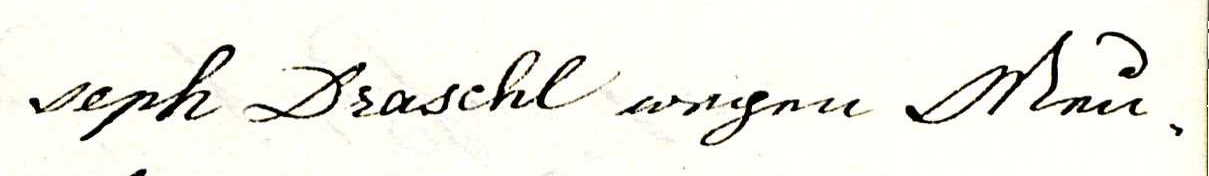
seph Draschl wegen Meu¬
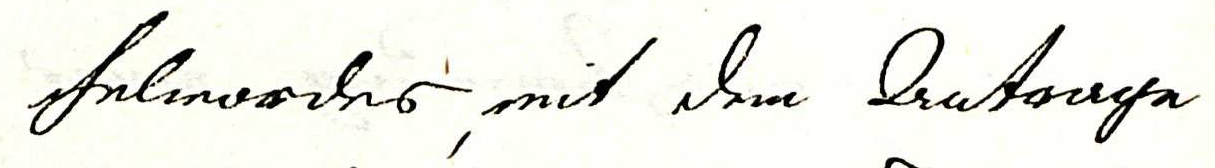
chelmordes, mit dem Antrage
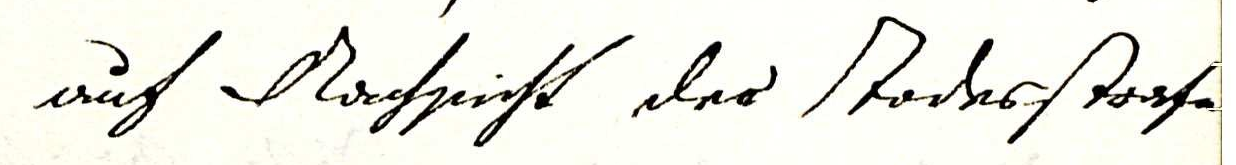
auf Nachsicht der Todesstrafe
